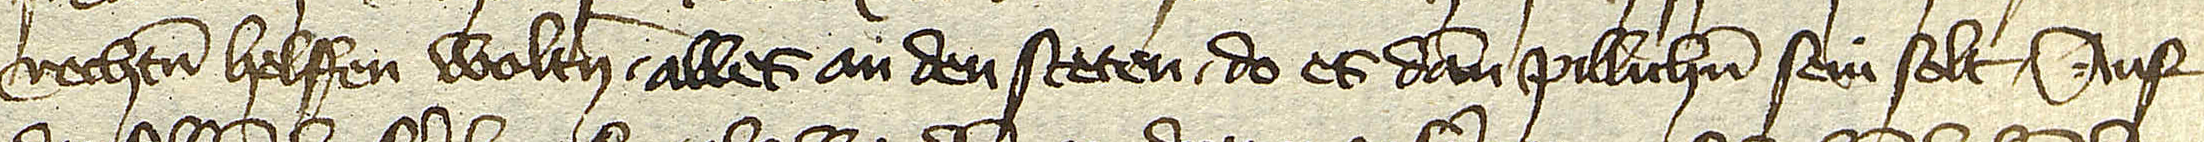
rechtn* helffen woltn* / alles an den ſteten / do es dan* pilllichn* ſein ſolt / Auf
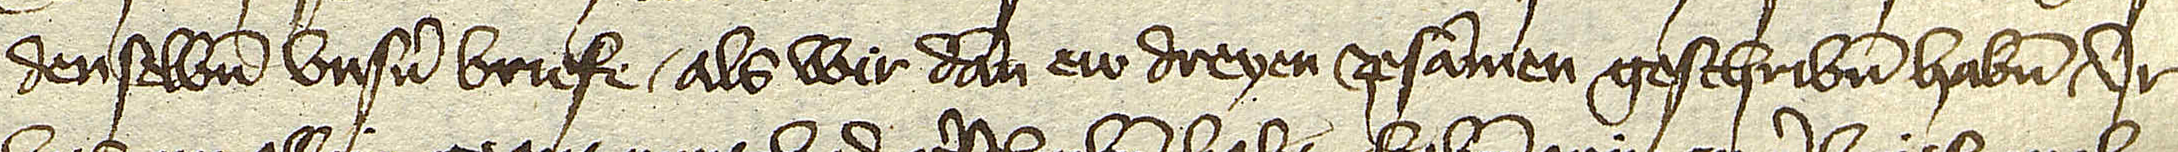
denſelbn* vnſn* briefe / als wir dan* ew dreyen cʒeſa*men geſchribn* habn* / Ir
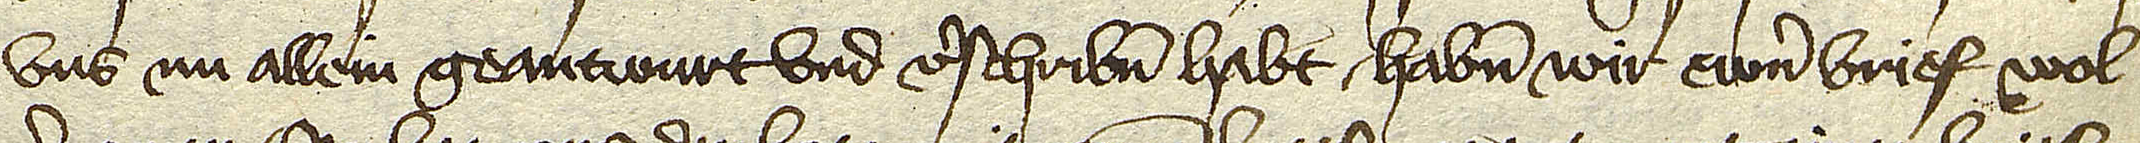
vns nu allein geantwurt vnd v*ſchribn* habt / habn* wir ewn* brief wol
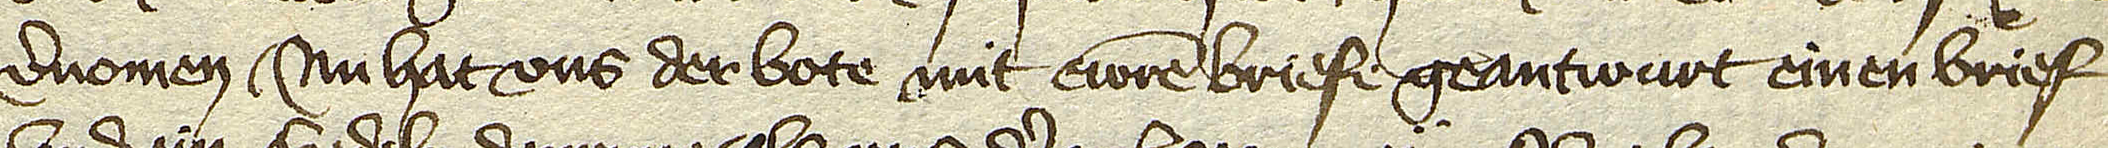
v*nomen / Nu hat vns der bote mit ewre* briefe geantwurt einen brief
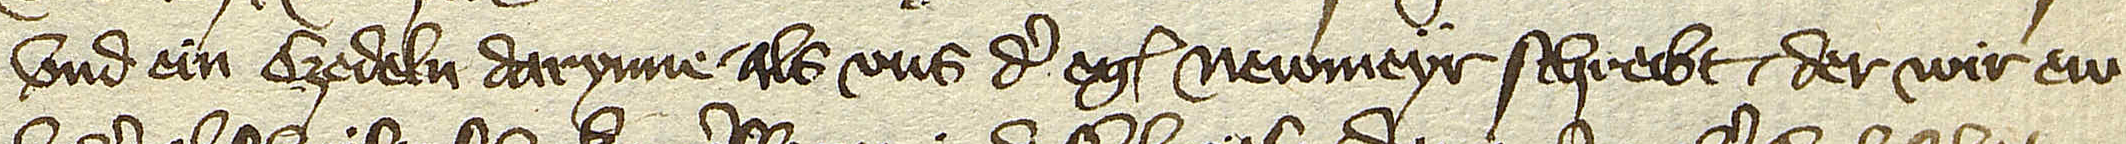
vnd ein Cʒedeln darynne / als vns d* eg* Newmeyr ſchreibt / der wir ew
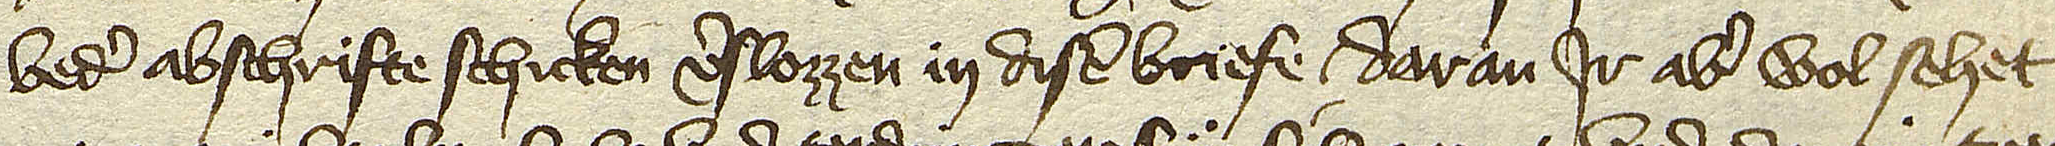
bed* abſchrifte ſchicken v*ſloʒʒen in diſe* briefe / daran Ir ab* wol ſehet
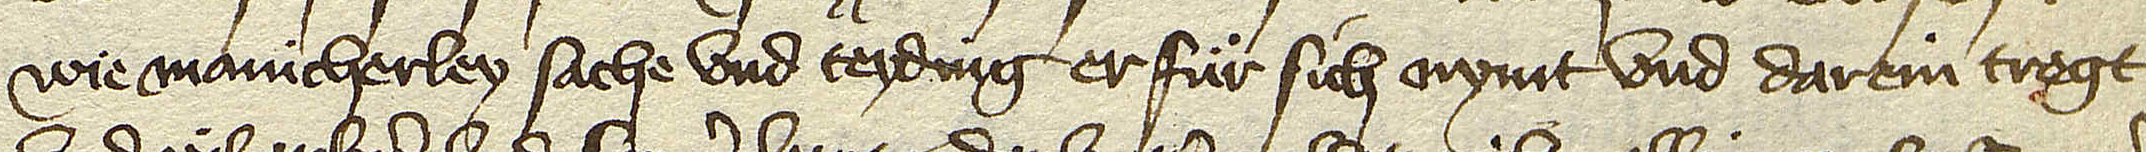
wie manicherley ſache vnd teyding er für ſich nymt vnd darein tregt
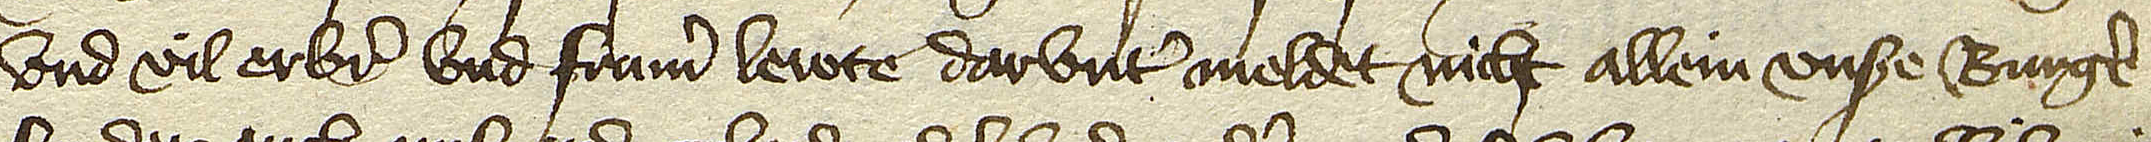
vnd vil erbr* vnd frum* lewte darvnt* meldet nicht allein vnſ*e Burge*
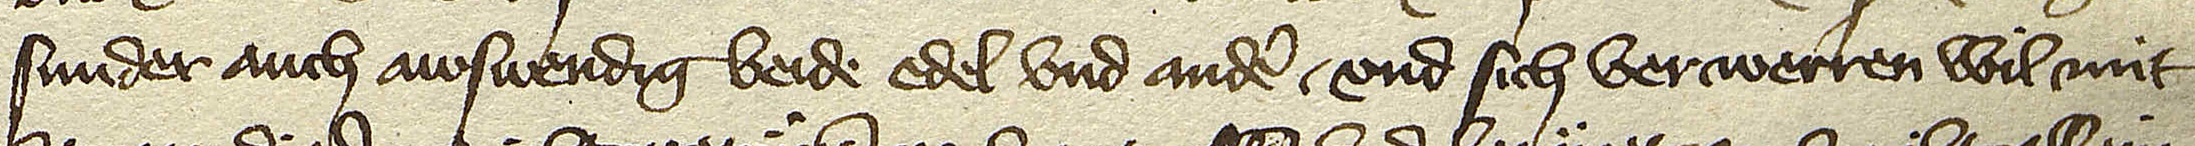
ſunder auch awſwendig beide edel vnd and* / vnd ſich verwerren wil mit
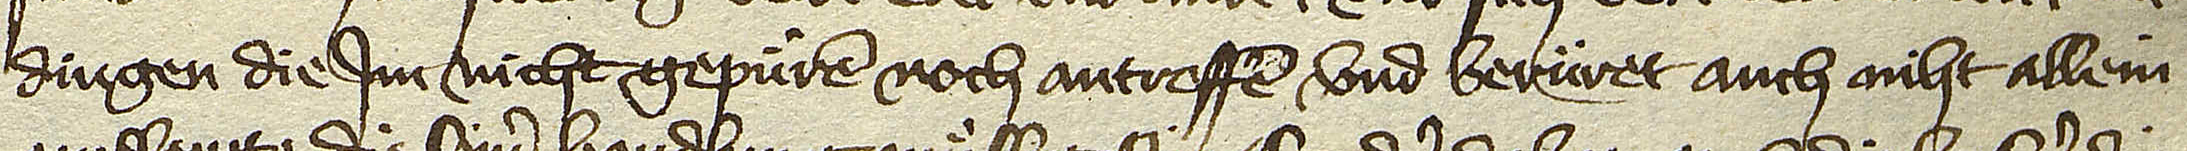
dingen die Im nicht gepüre* noch antreffe* / vnd berüret auch niht allein
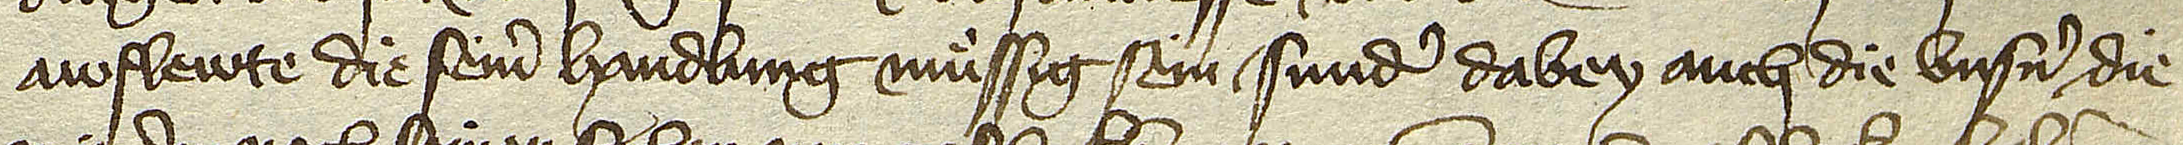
awflewte die ſein* handlung müſſig ſein / ſund* dabey auch die vnſn* / die
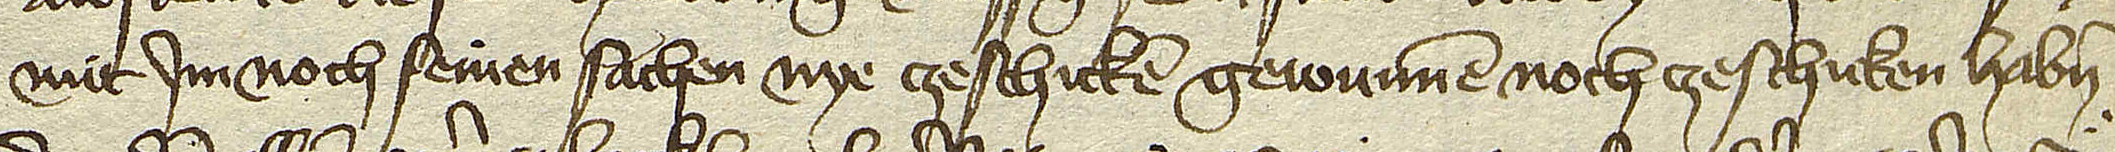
mit Im noch ſeinen ſachen nye cʒeſchicke* gewunne* noch cʒeſchicken habn*
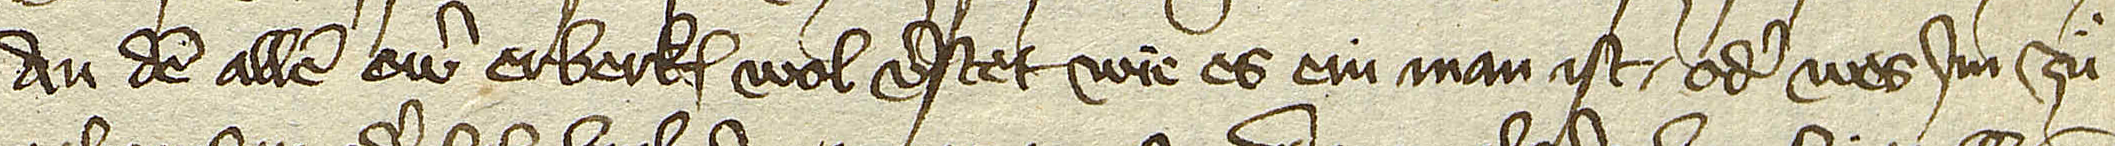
An d* alle* ew* erberk* wol v*ſtet wie es ein man iſt / od* wes Im cʒü
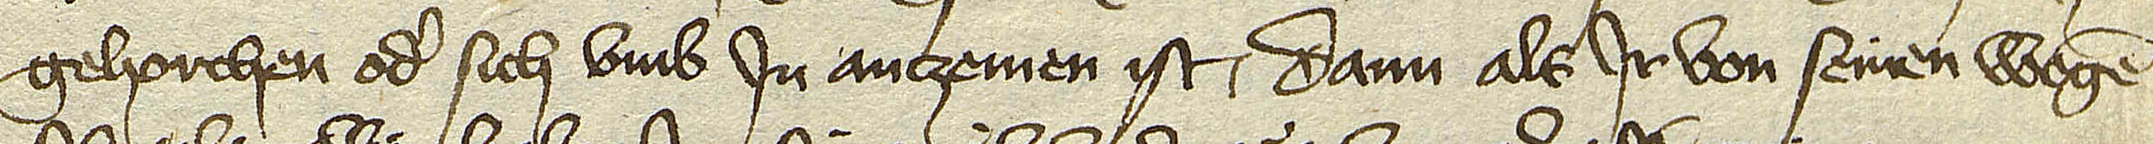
gehorchen od* ſich vmb In ancʒemen iſt / Dann als Ir von ſeinen wege*
